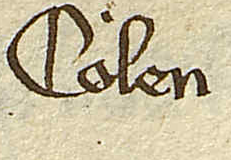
Cölen
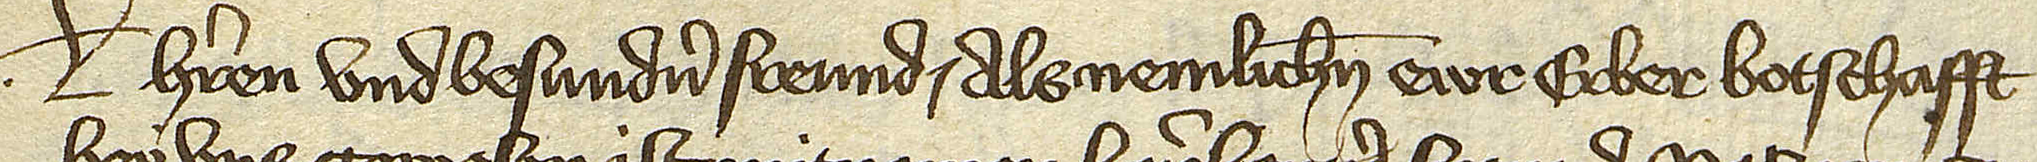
L* hr*en vnd beſundn* freund / Als nemlichn* ewr Erber botſchafft
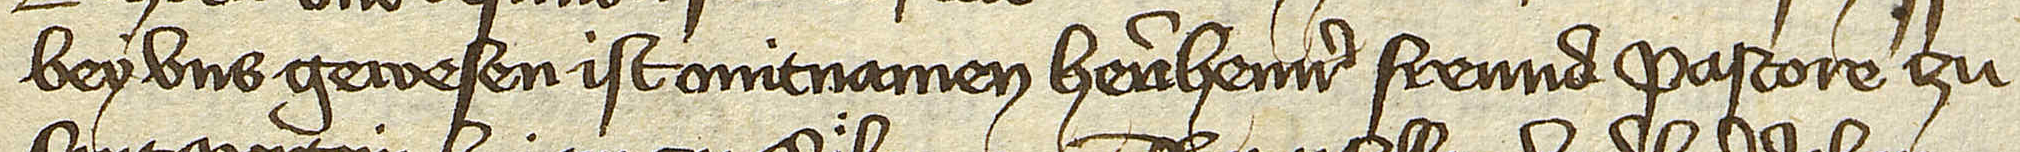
bey vns geweſen iſt mitnamen her* heinr* freund Paſtore cʒu
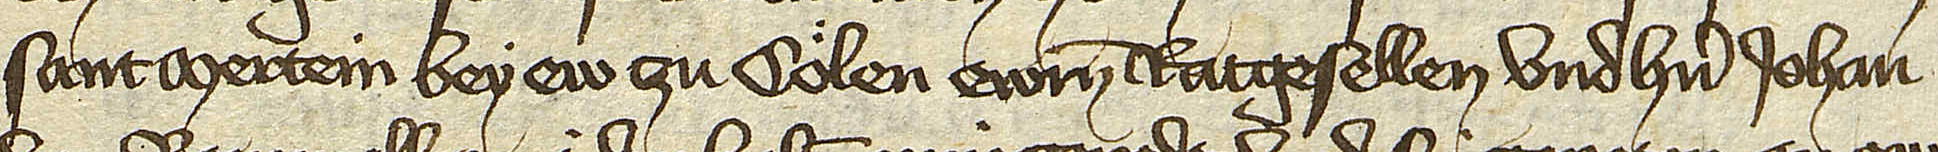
ſant Mertein bey ew cʒu Cölen ewrn* Ratgeſellen vnd hn* Iohan
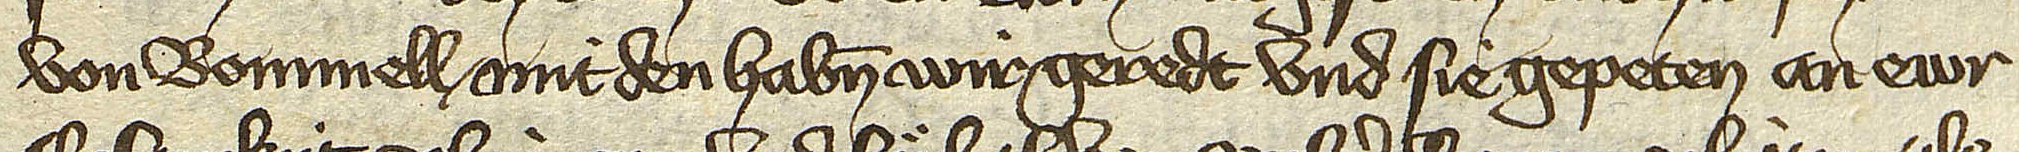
von Bommell / mit den habn* wir geredt vnd ſie gepeten an ewr
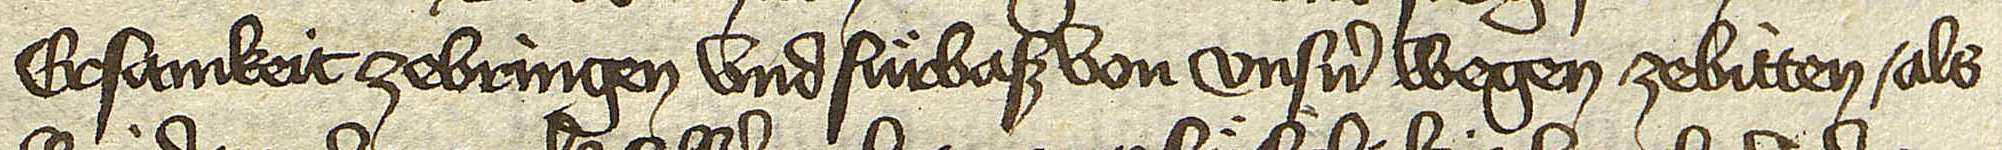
Erſamkeit cʒebringen vnd fürbaſʒ von vnſn* wegen cʒebitten / als
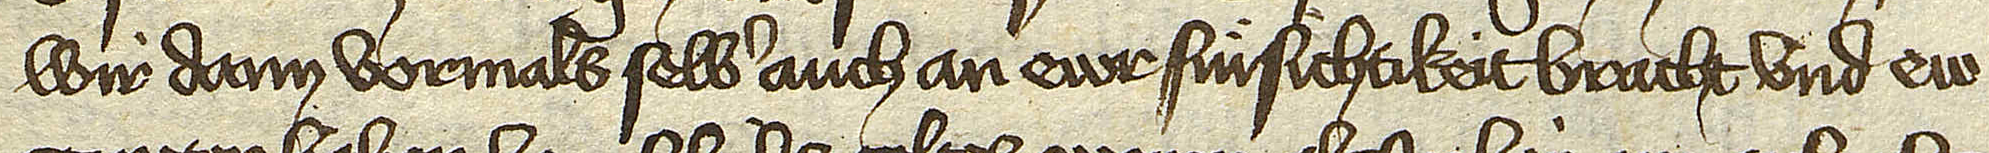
wir dann vormals ſelb* auch an ewr fürſichtikeit bracht vnd ew
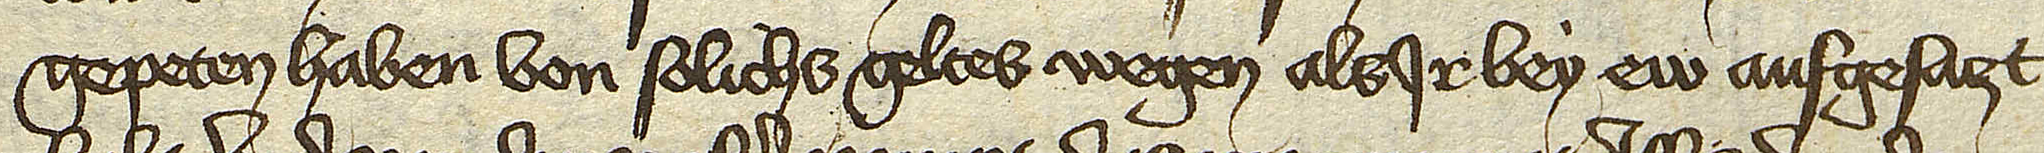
gepeten haben von ſolichs geltes wegen als Ir bey ew aufgeſacʒt
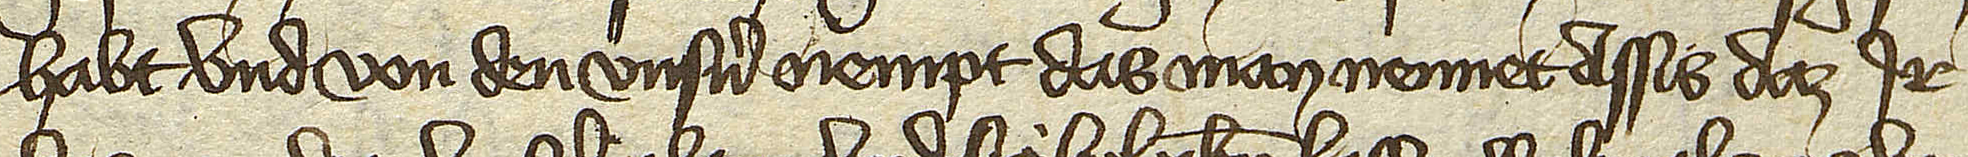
habt vnd von den vnſn* nempt das man nemet Aſſis daʒ Ir
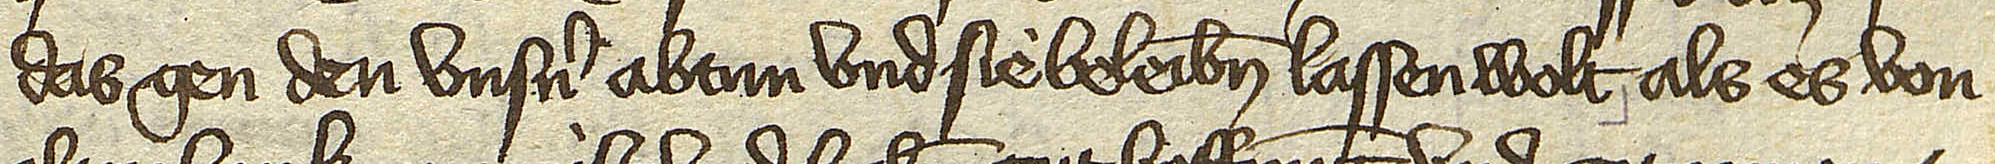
das gen den vnſn*abtun vnd ſie beleibn* laſſen wolt als es von
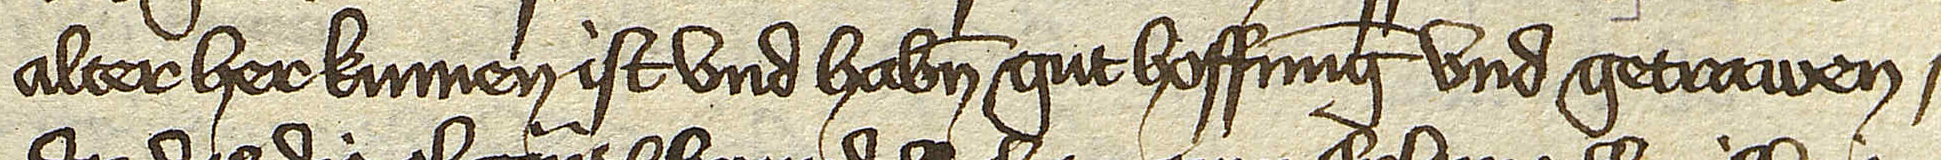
alter her kumen iſt vnd habn* gut hoffnug* vnd getrawen /
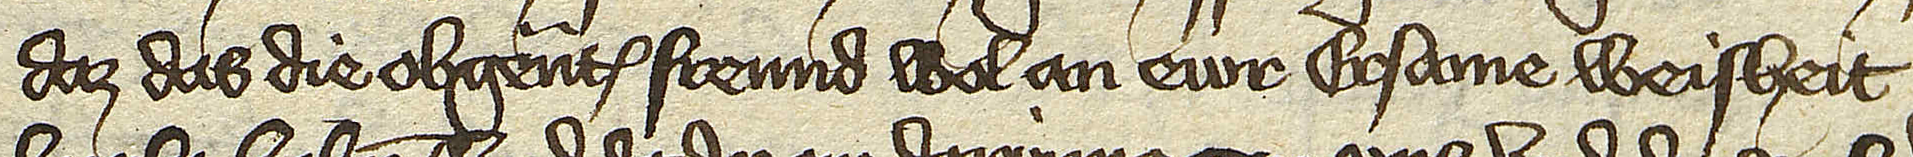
daʒ das die obgent* freund wol an ewr Erſame weiſheit
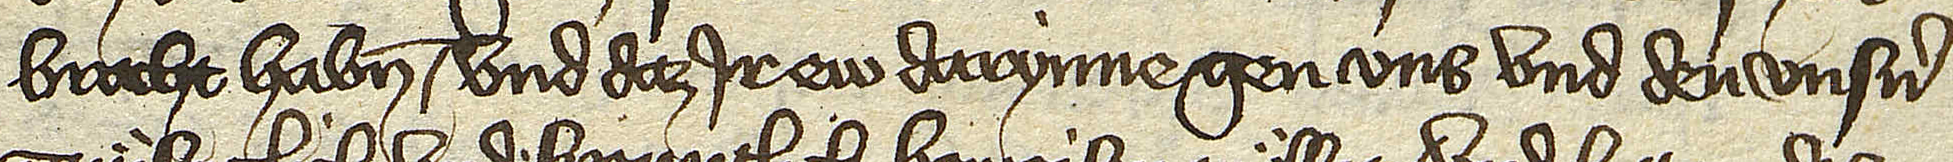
bracht habn* / vnd daʒ Ir ew darynne gen vns vnd den vnſn*
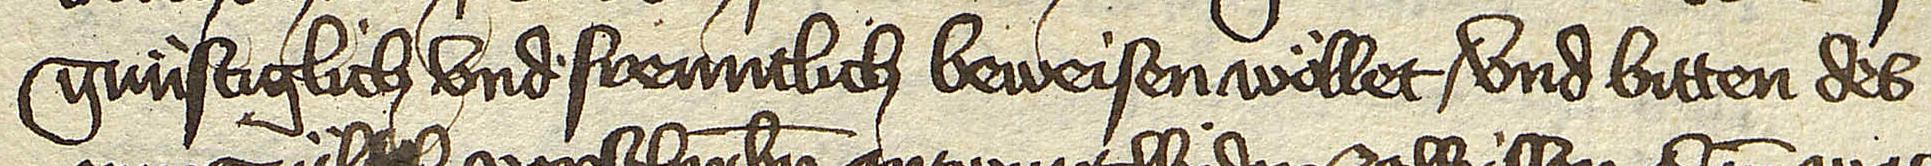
günſtiglich vnd freuntlich beweiſen wöllet / vnd bitten des
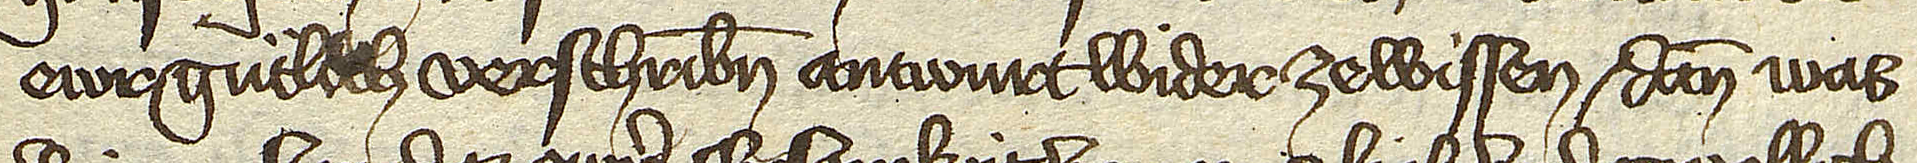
ewr gütlich verſchribn* antwurt wider cʒewiſſen / dan* was
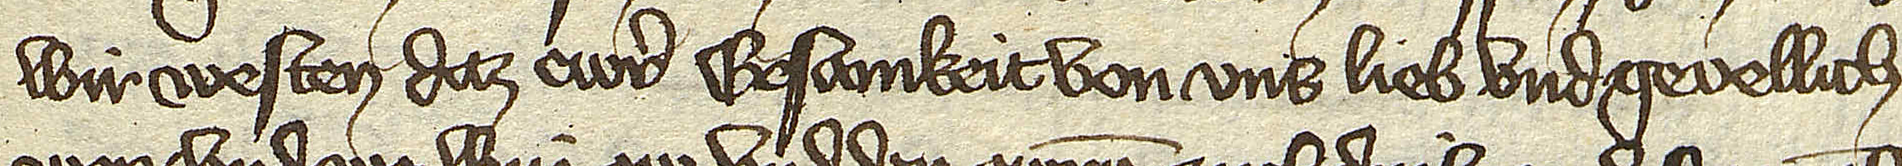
wir weſten daʒ ewr* Erſamkeit von vns lieb vnd gevellich
